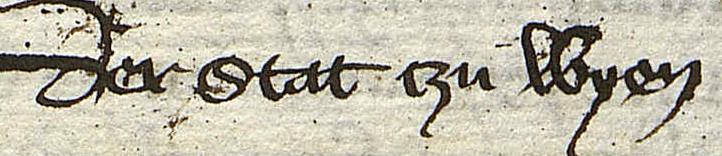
Der Stat cʒu Wyen
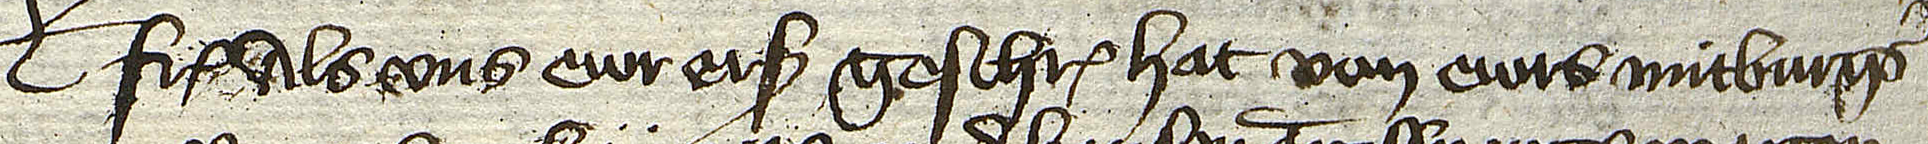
L* fr* Als vns ewr erſ* geſchr* hat von ewrs mitburg*s
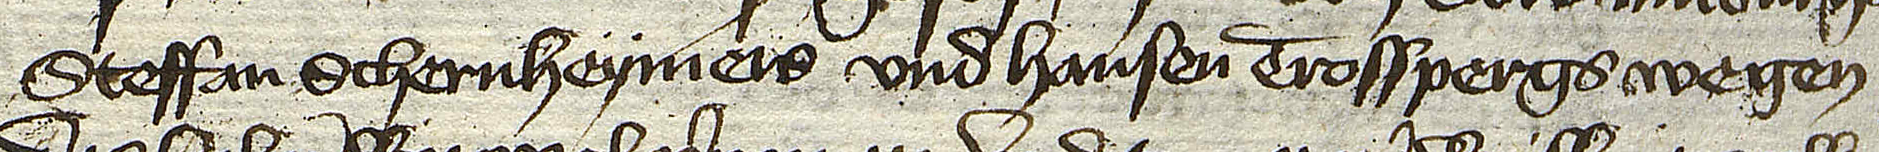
Steffan Schernheymers vnd hanſen Troſſpergs wegen
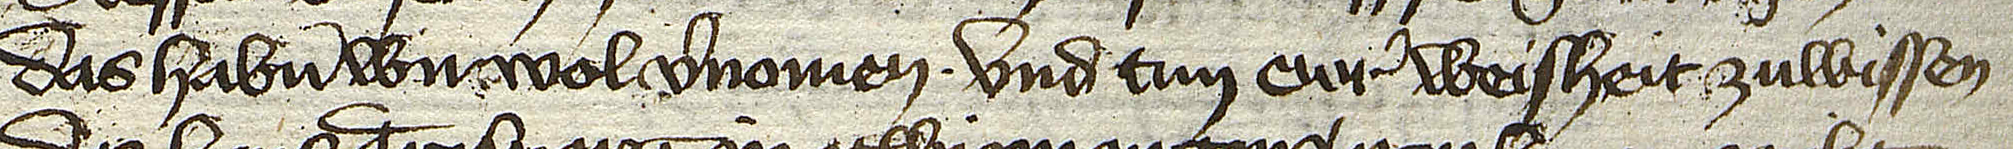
Das hab*n wir wol v*nomen . Vnd tun ewr* weiſheit ʒu wiſſen
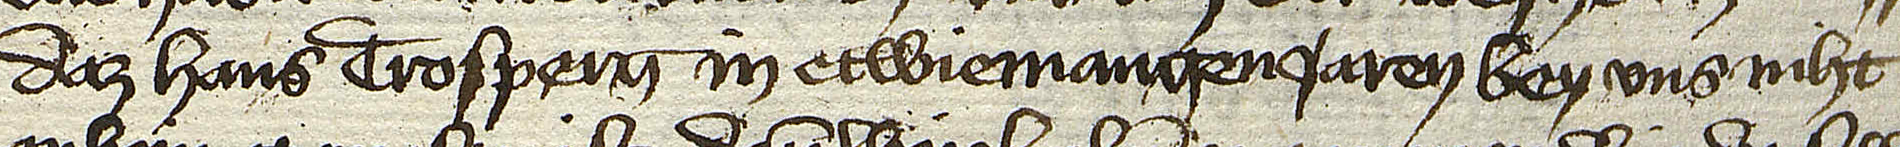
daʒ hans Troſperg in etwiemangen Iaren bey vns niht
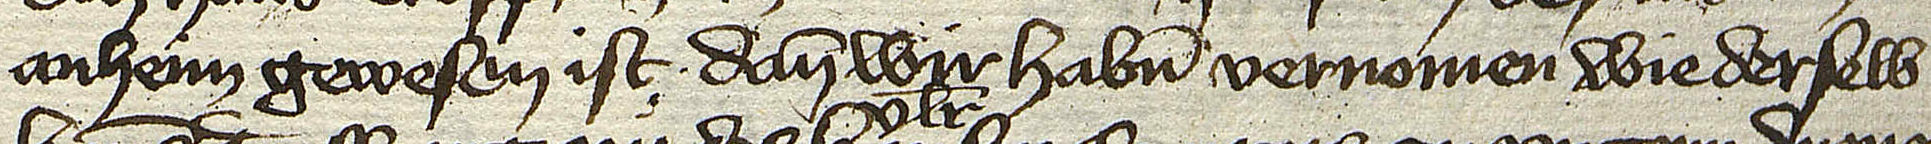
anheim geweſen iſt . dan* wir hab*n vernomen wie derſelb
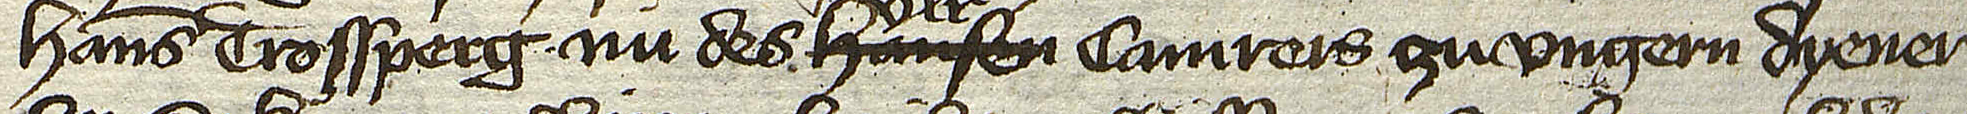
Hans* Troſſperg . nü des Hanſen Camrers cʒu vngern dyener
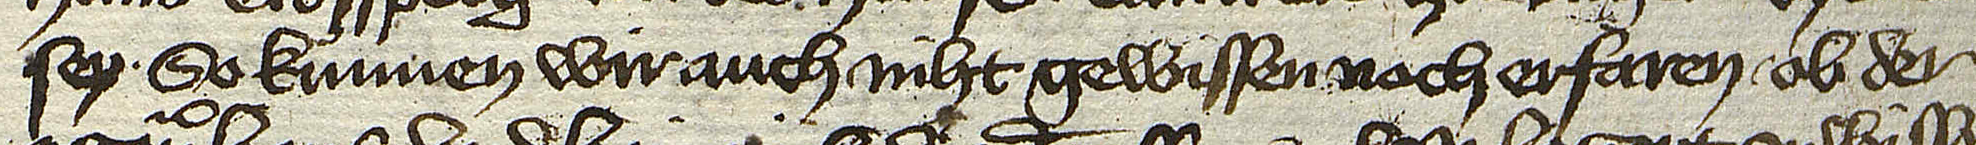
ſey . So künnen wir auch niht gewiſſen noch erfaren / ob der
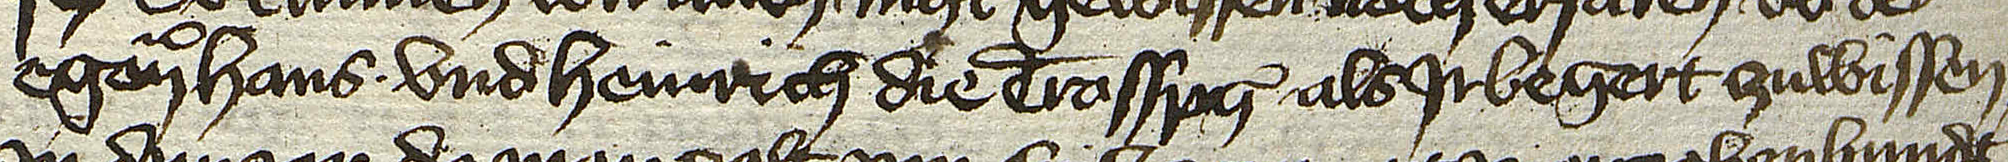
egen* hans . vnd heinrich die Troſſp*g als Ir begert cʒuwiſſen
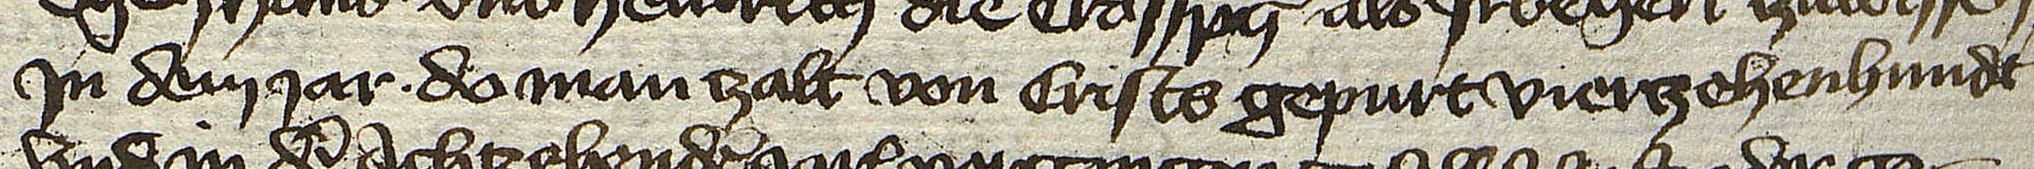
In dem Iar . do man cʒalt von Criſts gepurt viercʒehenhundt*
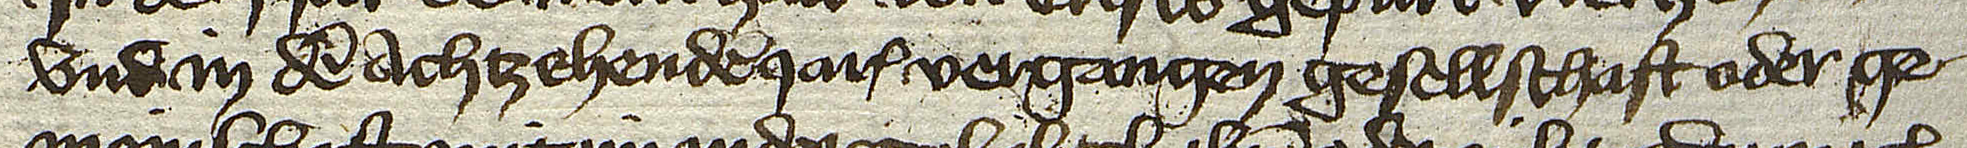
vnd in de* achcʒehend* Iar* vergangen geſellſchaft oder ge -
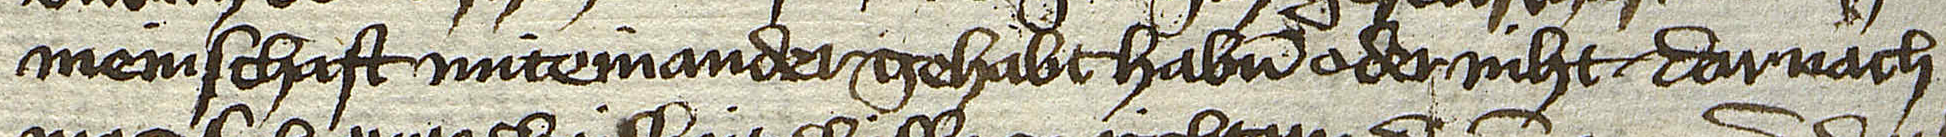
meinſchaft miteinander gehabt hab*n . der niht / darnach
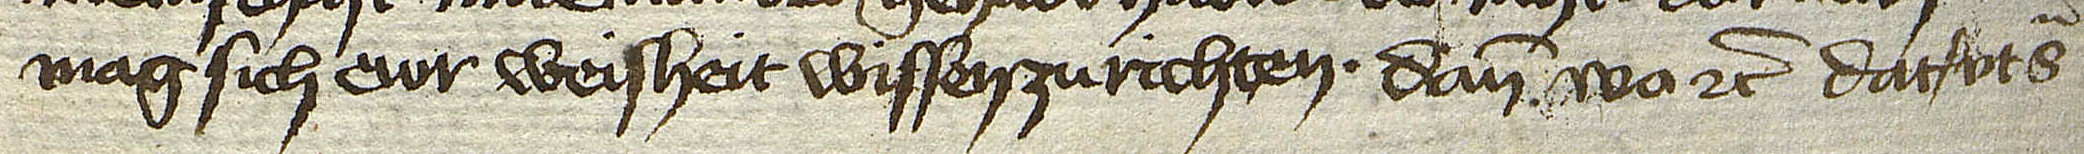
mag ſich ewr weiſheit wiſſen ʒu richten . dan* wo ec* dat* vt s*
